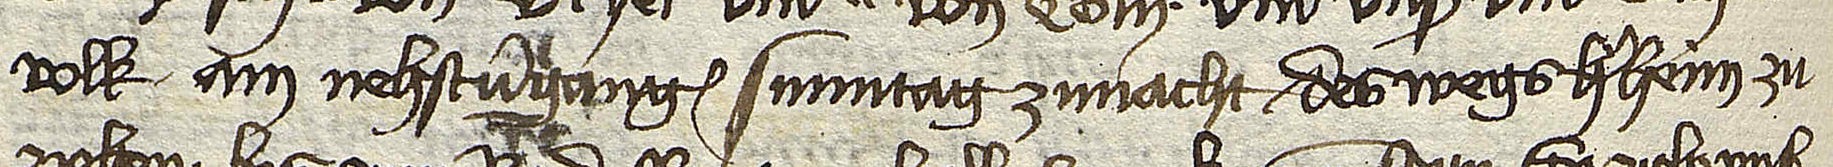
volk / am nehſtu*gang* ſunntag ʒunacht / des wegs h*heim ʒu
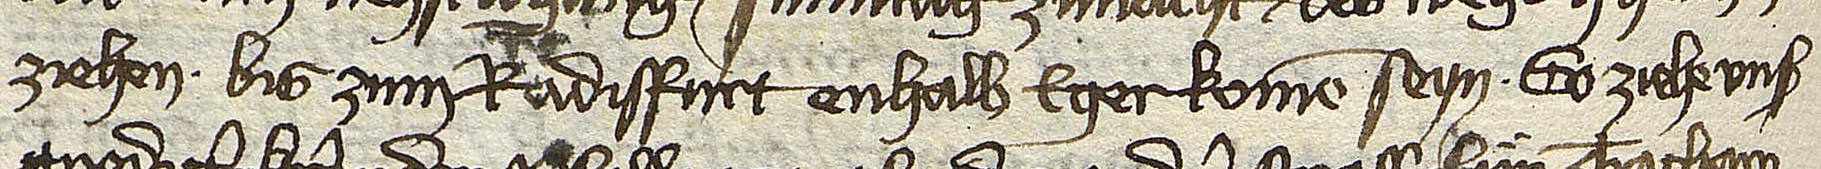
ʒiehen . bis ʒum Radiſfurt enhalb Eger kome* ſeyn . So ʒiehe vnſ*
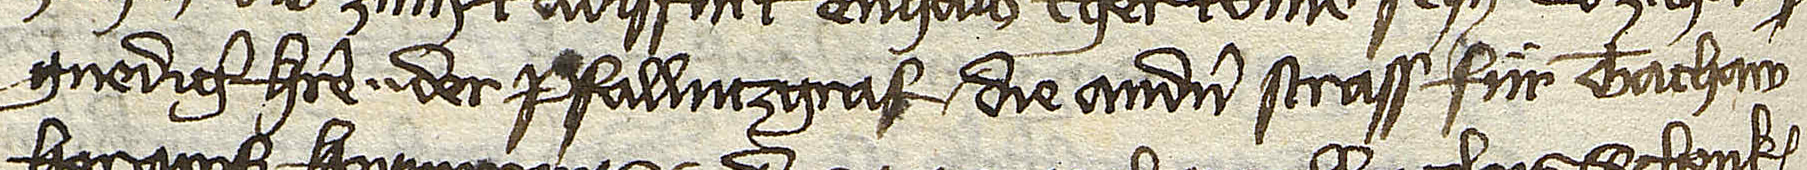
gnedig* h*re ~der Pfallncʒgraf / die and*n ſtraſſ für Tachaw
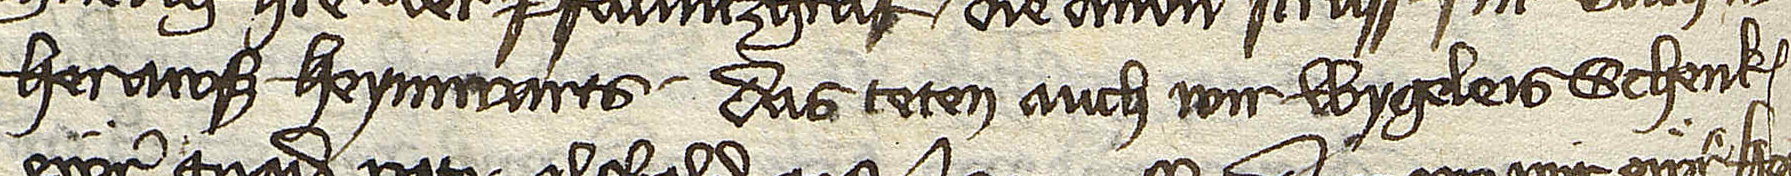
herawſʒ heymwarts . Das teten auch wir Wygeleis Schenk*
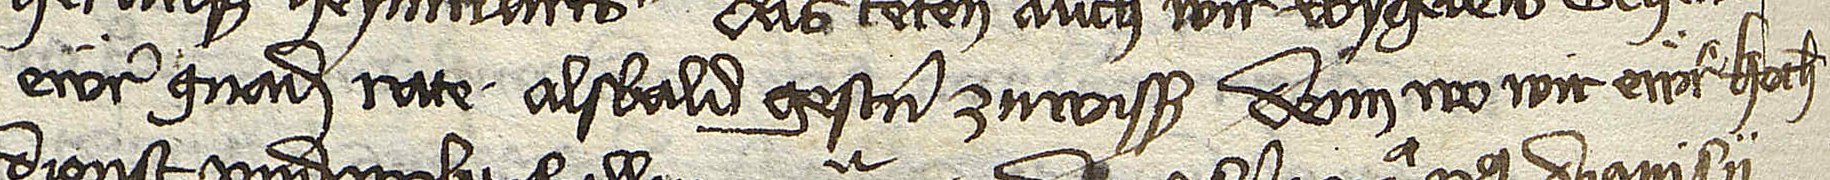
ew*r gnad* rate . alſbald geſt*n ʒuwiſſ* / Denn wo wir ew*r hoch*
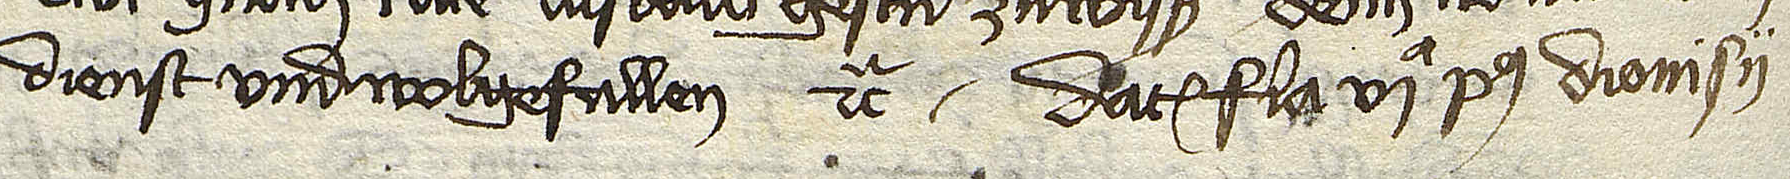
dienſt vnd wolgefallen ec* / Dat* fia* vi* p* dioniſii
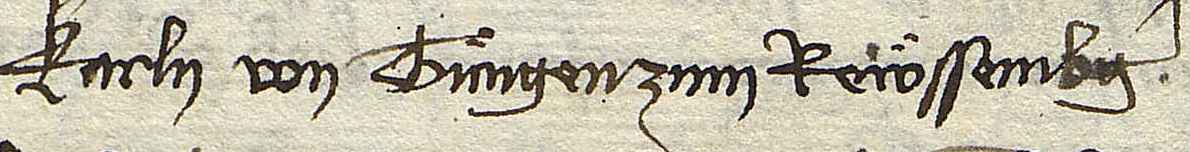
Karln von Tüngen ʒum Rewſſemb*g
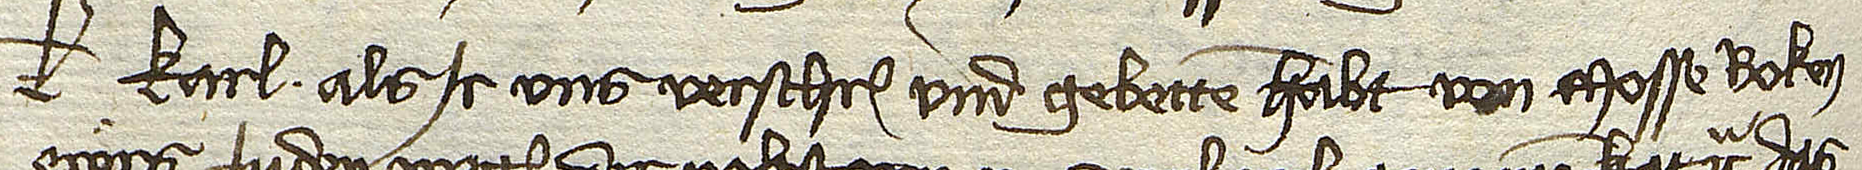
L* Karl . als Ir vns verſchr* vnd gebette* habt von Moſſe Boken
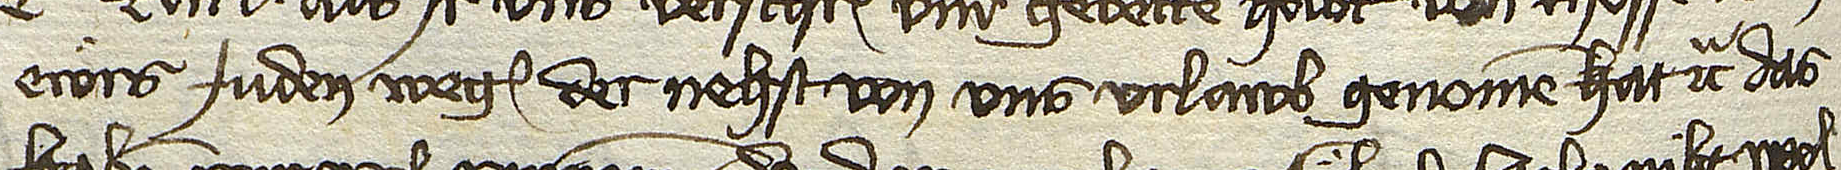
ewrs Iuden weg* der nehſt von vns vrlawb genome* hat ec* das
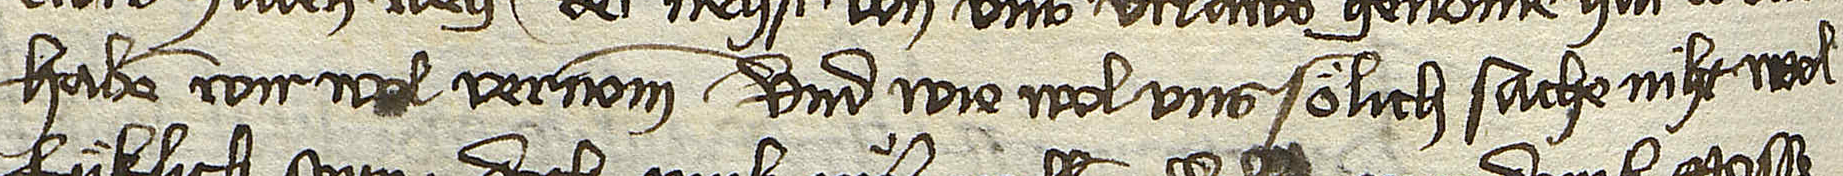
habe* wir wol vernom* / Vnd wie wol vns ſölich ſache niht wol
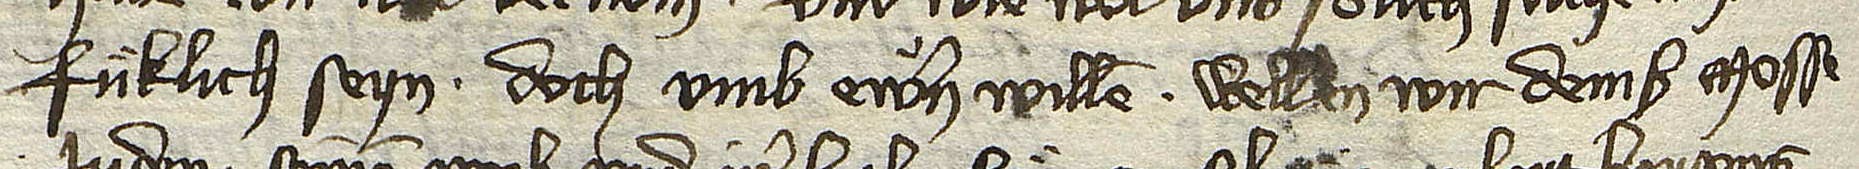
füklich ſeyn . doch vmb ew*n wille* . wellen wir demſ* Moſſe
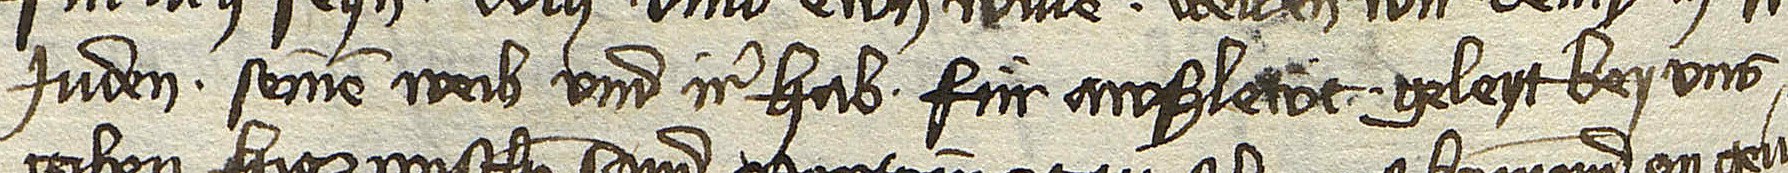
Iuden . ſeine* weib vnd ir hab . für awſʒlewt . geleyt bey vns
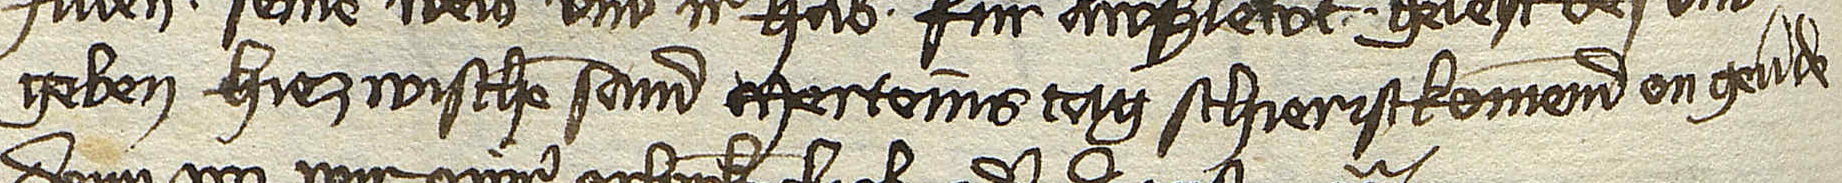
geben hieʒwiſche* ſand Merteins tag ſcheriſt kom*end on geu*de
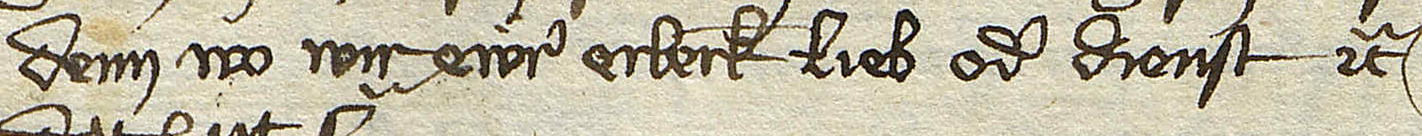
Denn wo wir ew*r erberk* lieb od* dienſt ec*
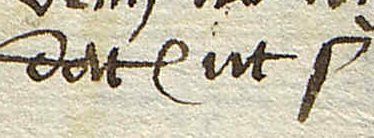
dat* ut ſ*
